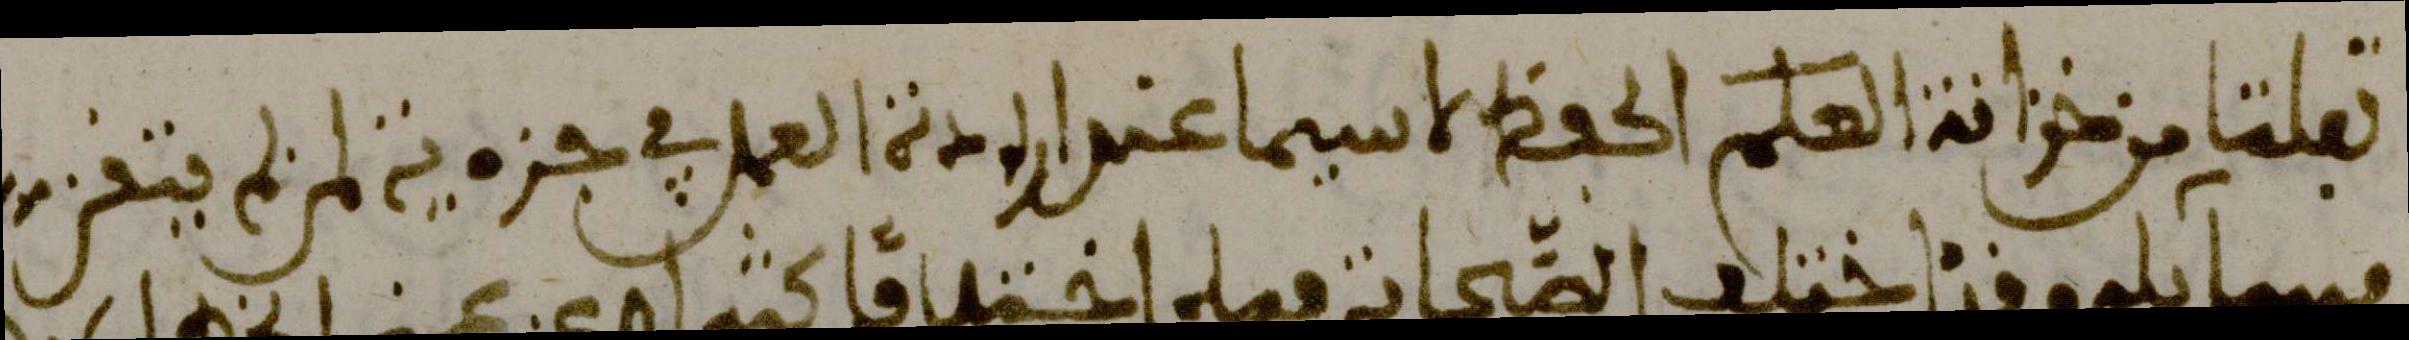تفلتا من خزانة العلم الحفظ لا سيما عند ارادة العمل في جزءية لمن لم يتقن
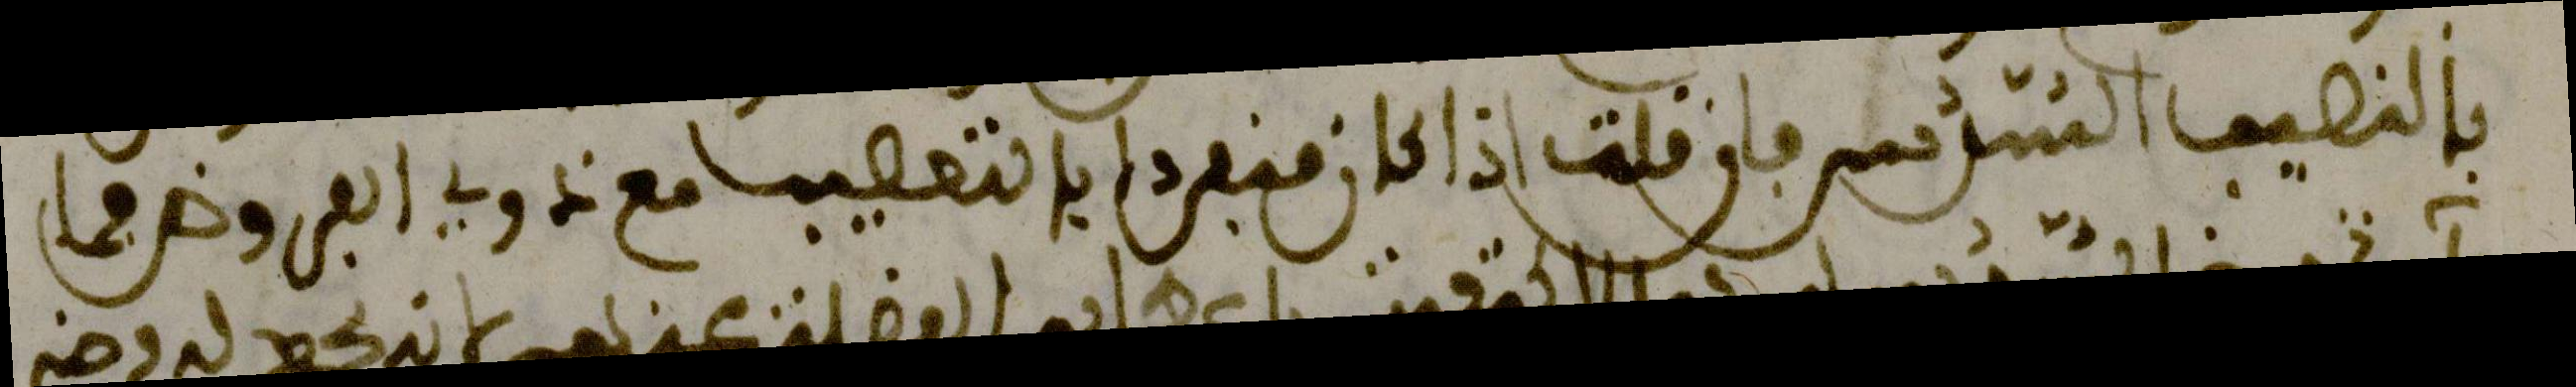بالنصيب السدس فان قلت اذا كان منفرد بالتعصيب مع ذوي الفروض فما
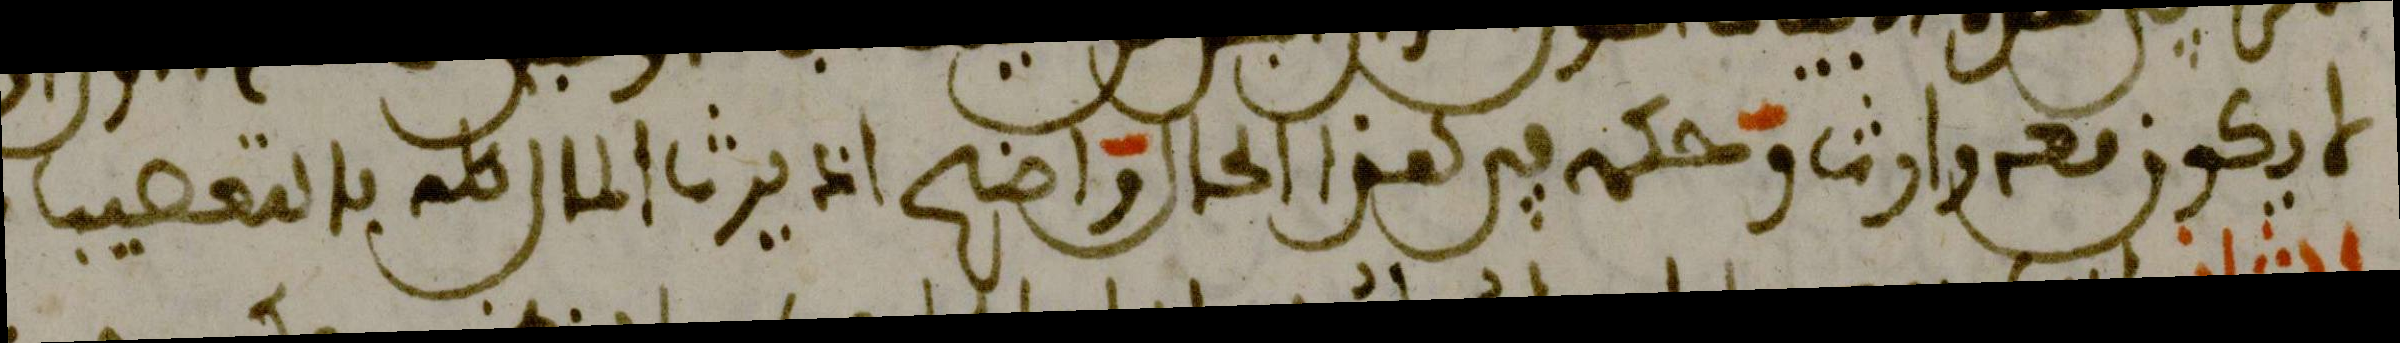لا يكون معه وارث وَحكمه في هذا الحال وَاضح اذ يرث المال كله بالتعصيب
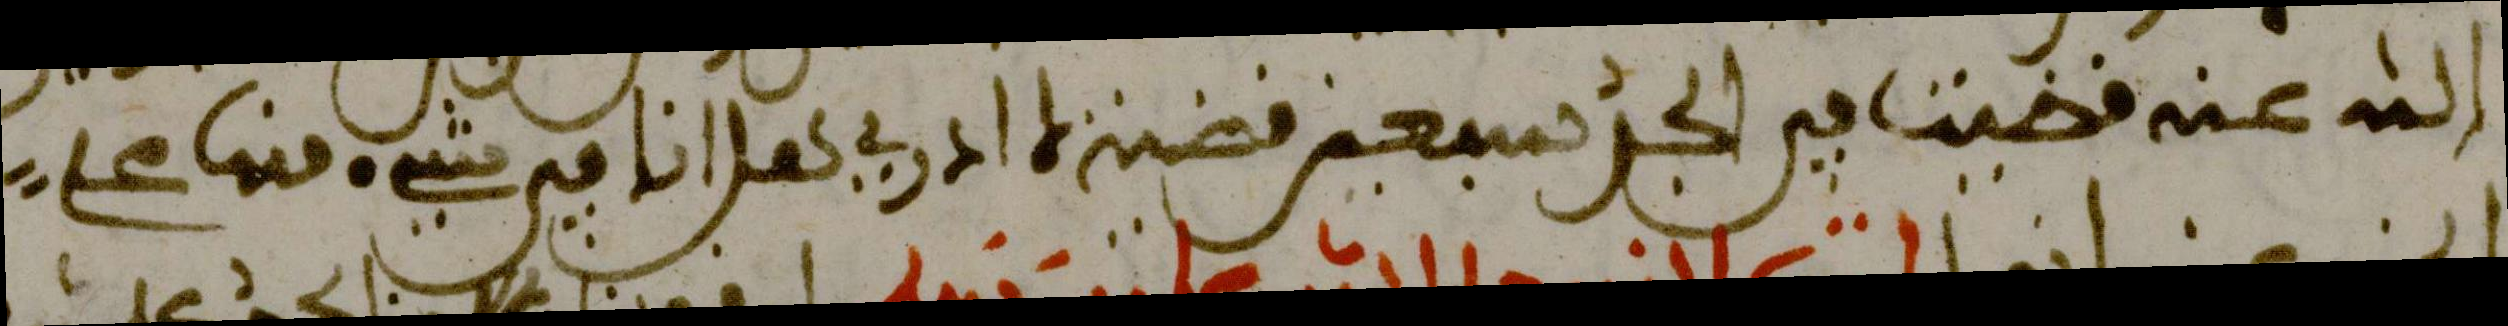الله عنه قضيت في الجد سبعين قضية لا ادري هل انا في شيء منها على
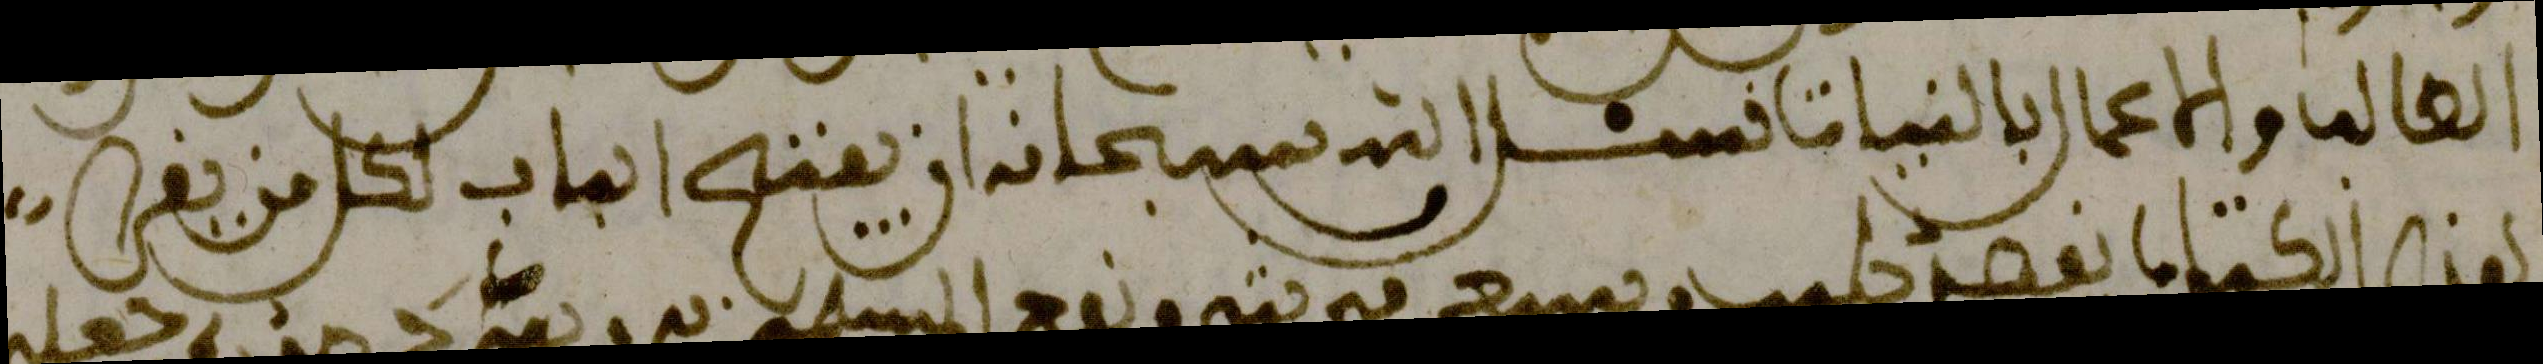الطالب والاعمال بالنيات فسئل الله سبحانه ان يفتح الباب لكل من يفرا
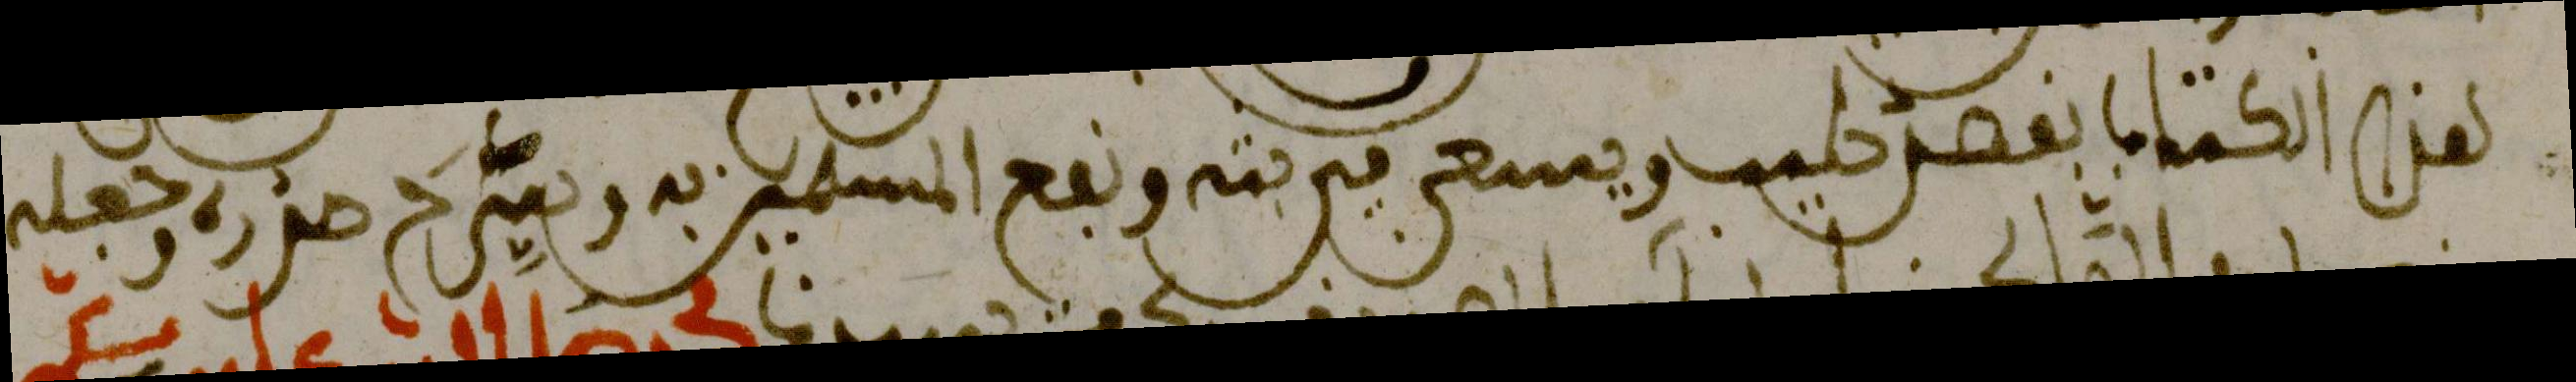هذا الكتاب بقصد طيب ويسعى في بثه ونفع المسلمين به ويشرح صدره جعله
